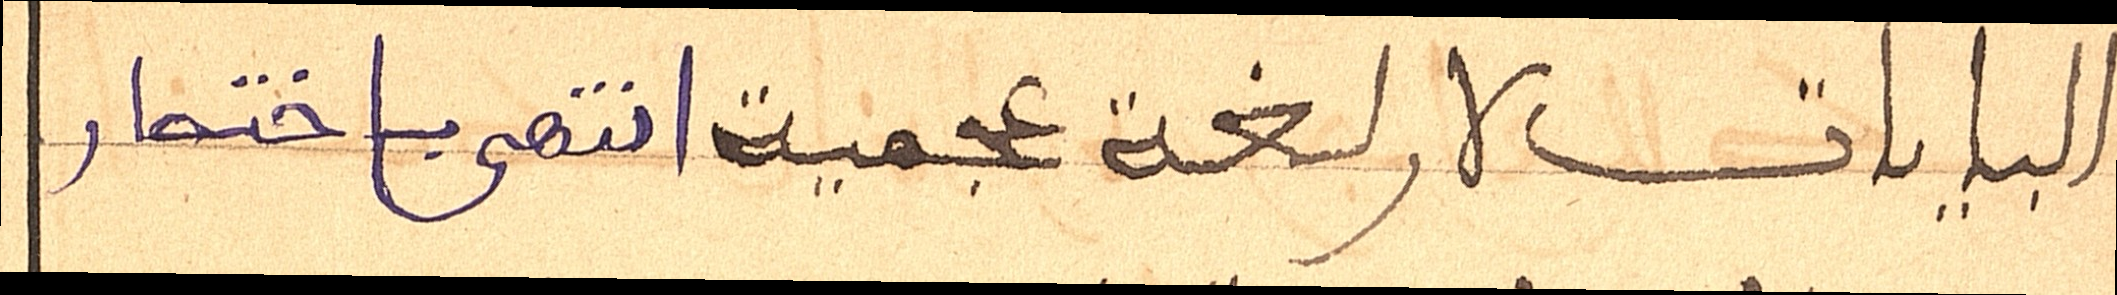البايات لارلغة عجمية انتهى باختصار
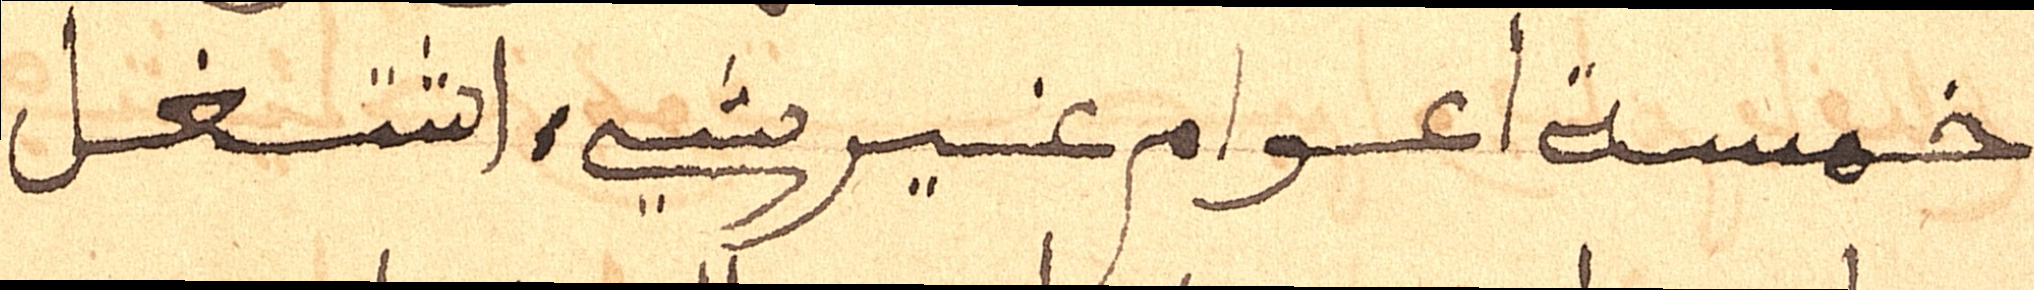خمسة اعوام غير شيء اشتغل
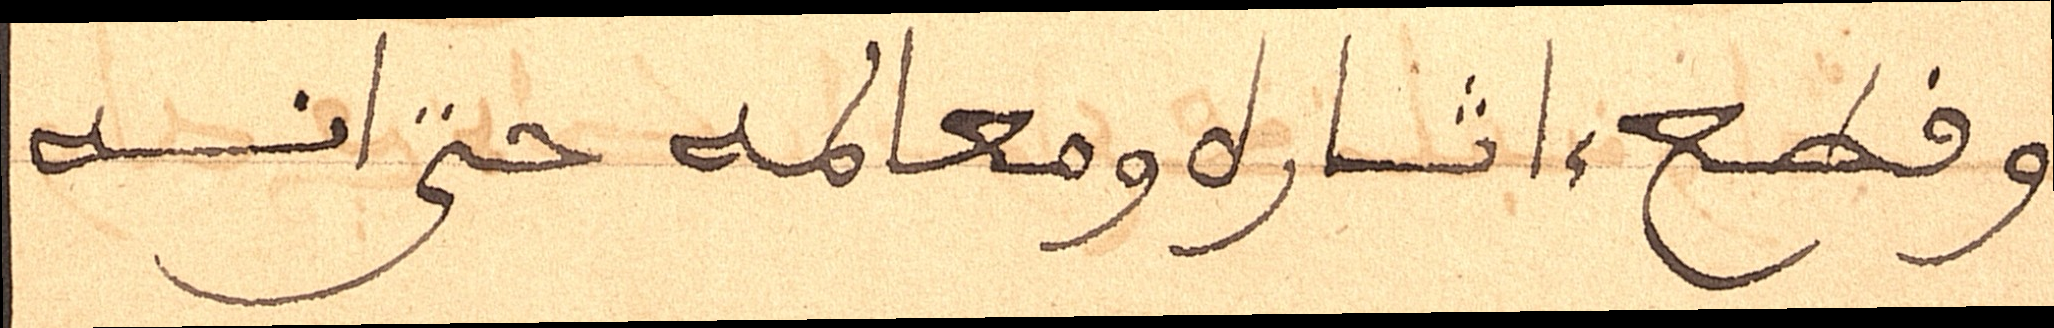وقطع ءاثاره ومعالمه حتى انه
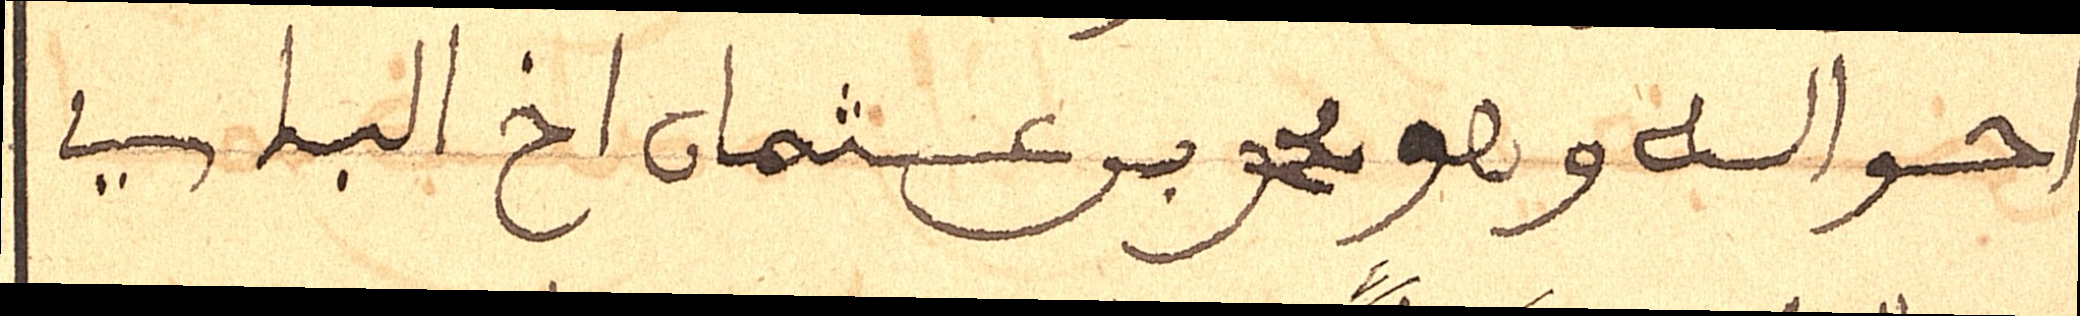احواله وهو محمد بن عثمان اخ الباي
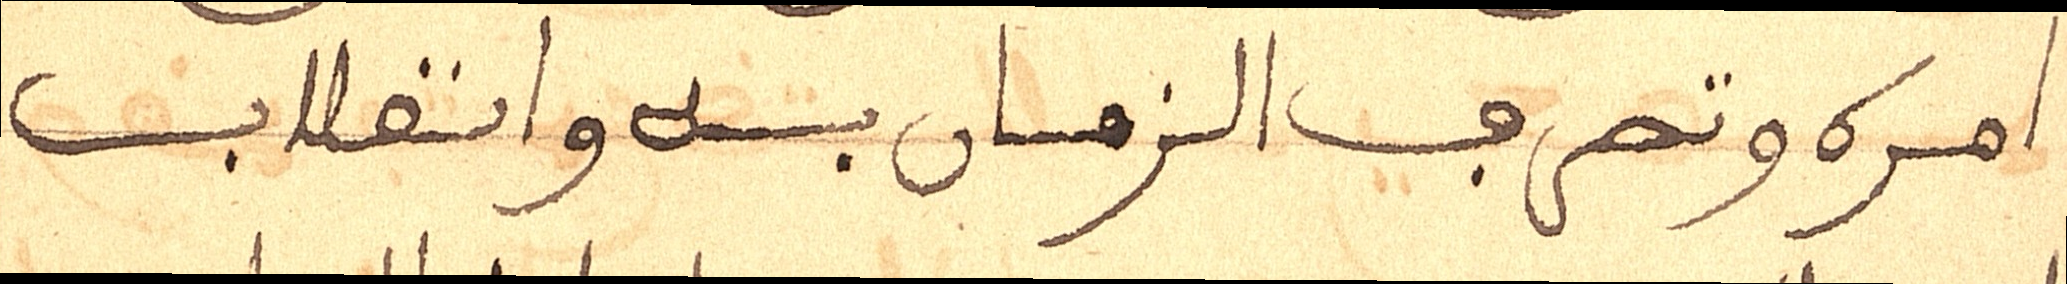امره وتصرف الزمان به وانقلاب
